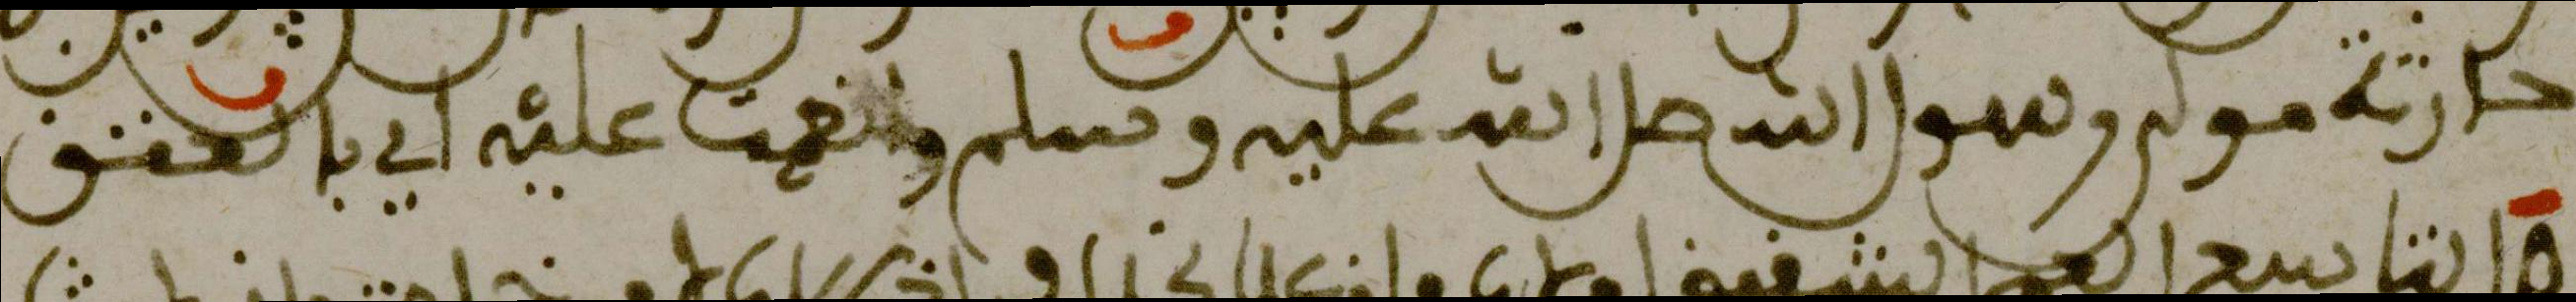حارثة مولى رسول الله صل الله عليه وسلم والنعمة عليْه اي بالعتق
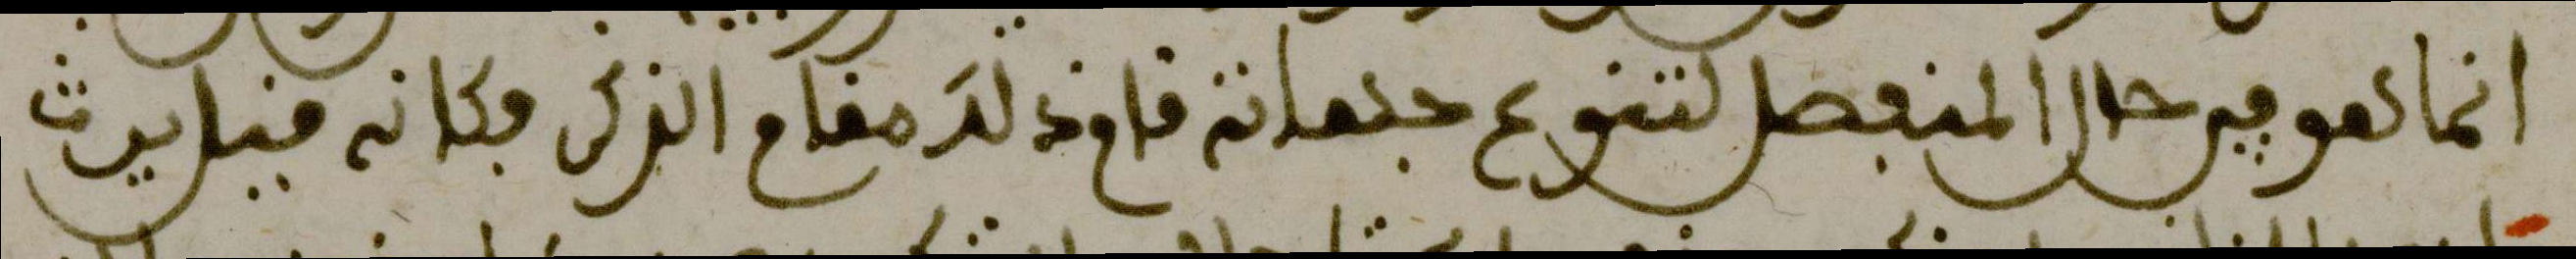انما هو في حال المنفصل لتنوع جهاته قام ذلك مقام الذكر فكانه قيل يرث
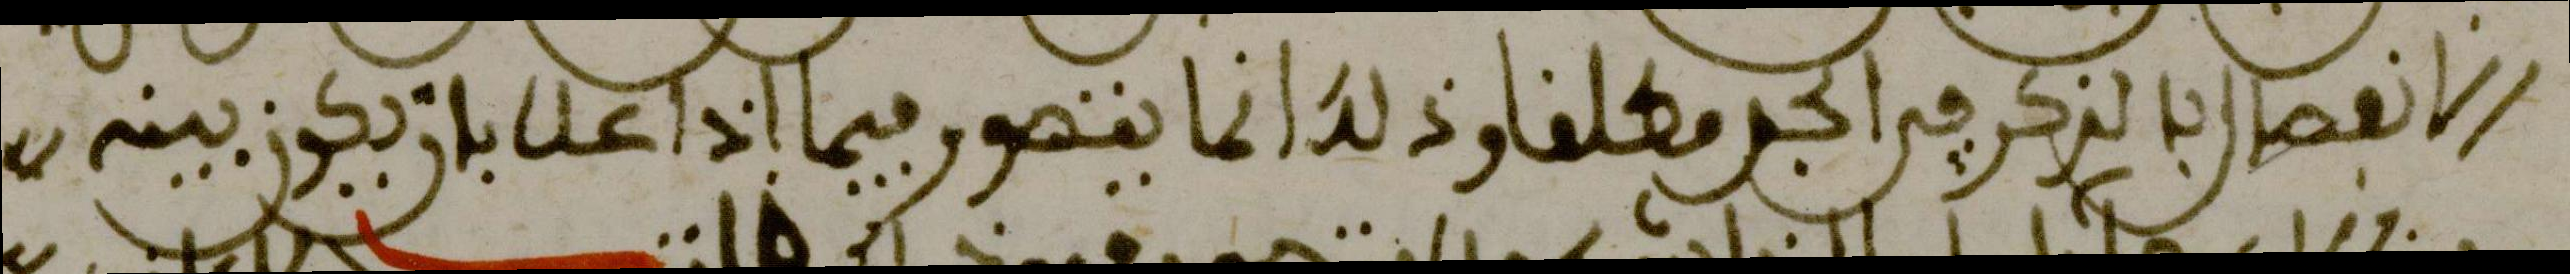الانفصال بالذكر في الجد مطلقا وذلك انما يتصور فيما اذا علا بان يكون بينه
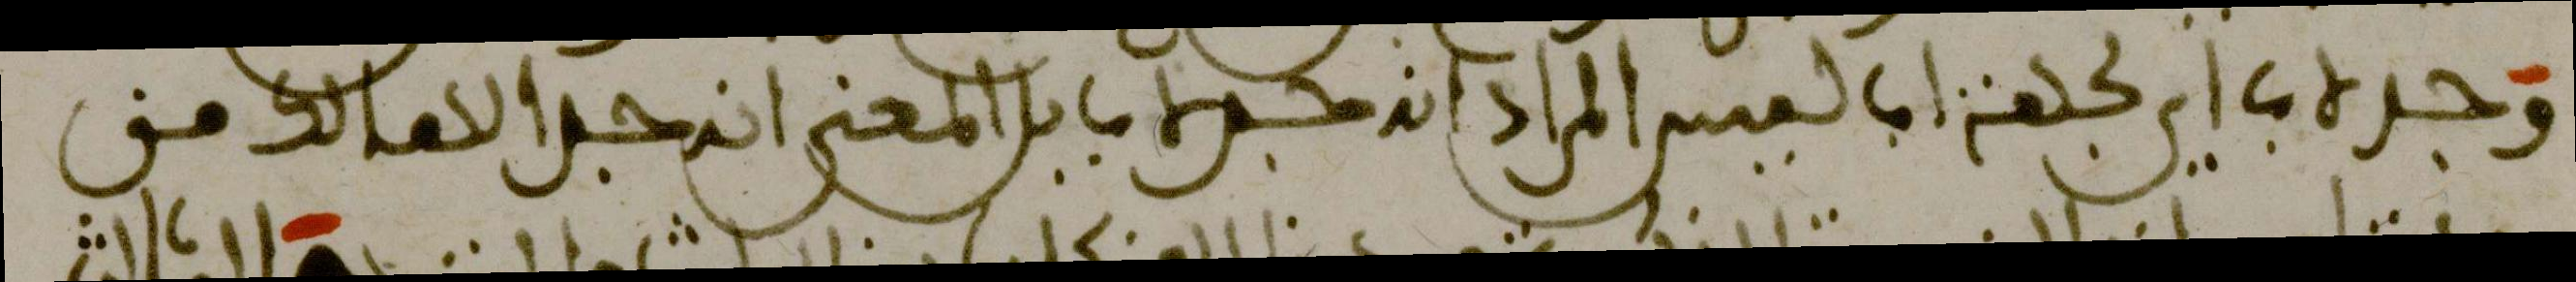وجد لاب اي لجهة اب ليس المراد انه جد لاب بل المعنى انه جد الهالك من
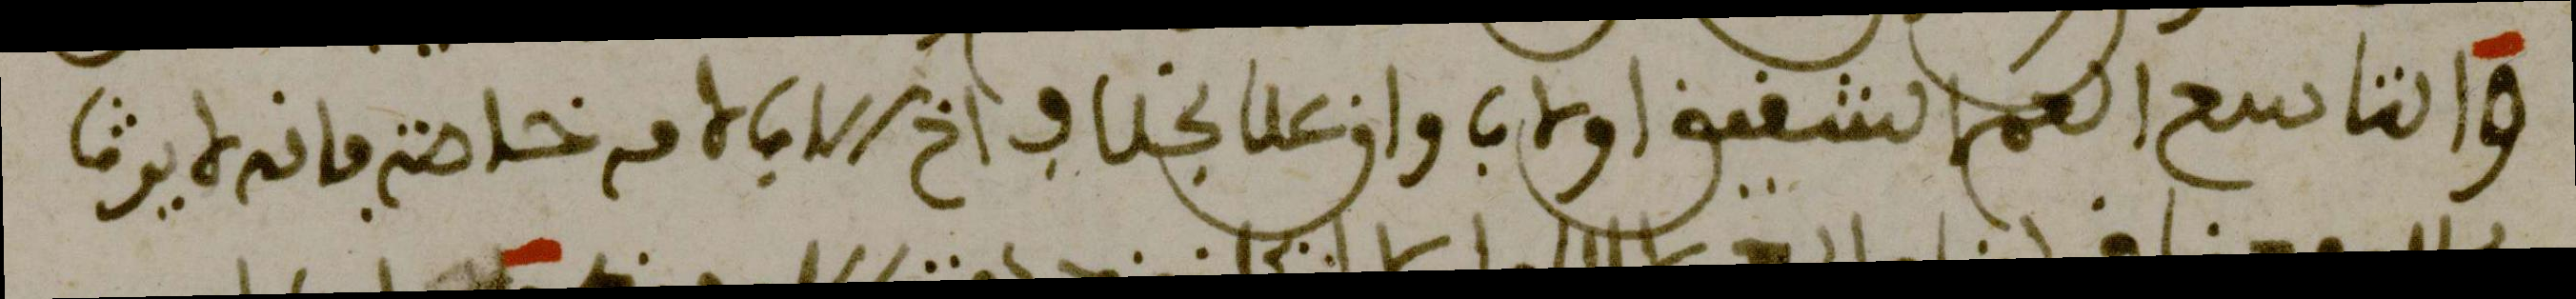والتاسع العم الشقيق او لاب وان علا بخلاف اخ الاب لامه خاصة فانه لا يرث
